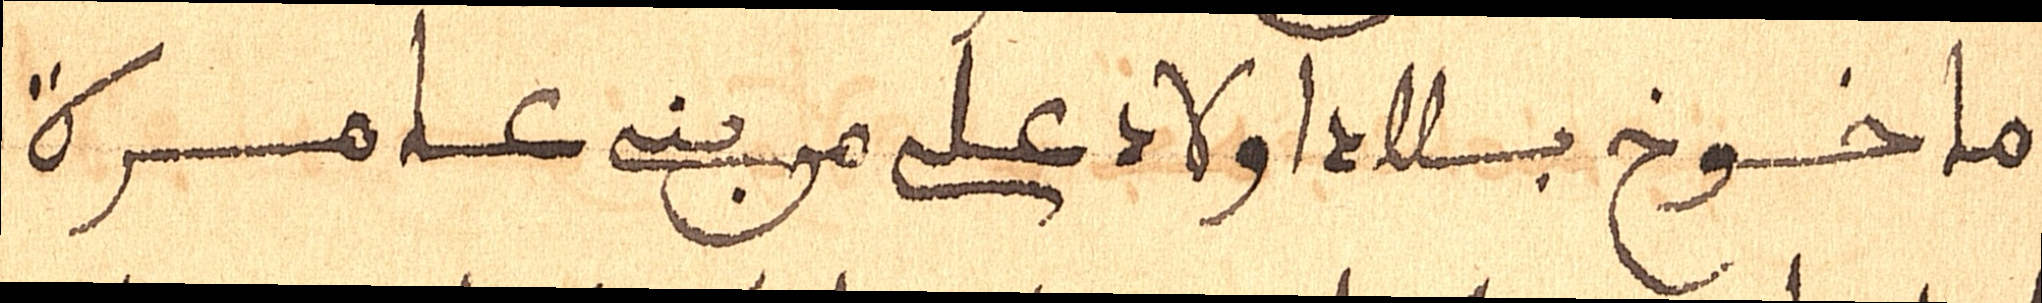ما خوج بلاد اولاد على من بنى عامرة
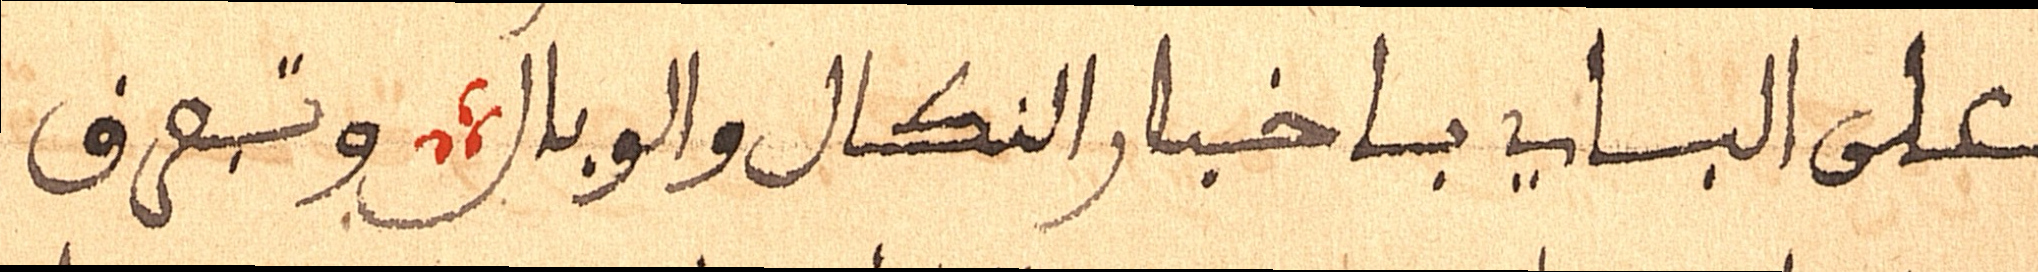على الباي باخبار النكال والوبال وتفرق
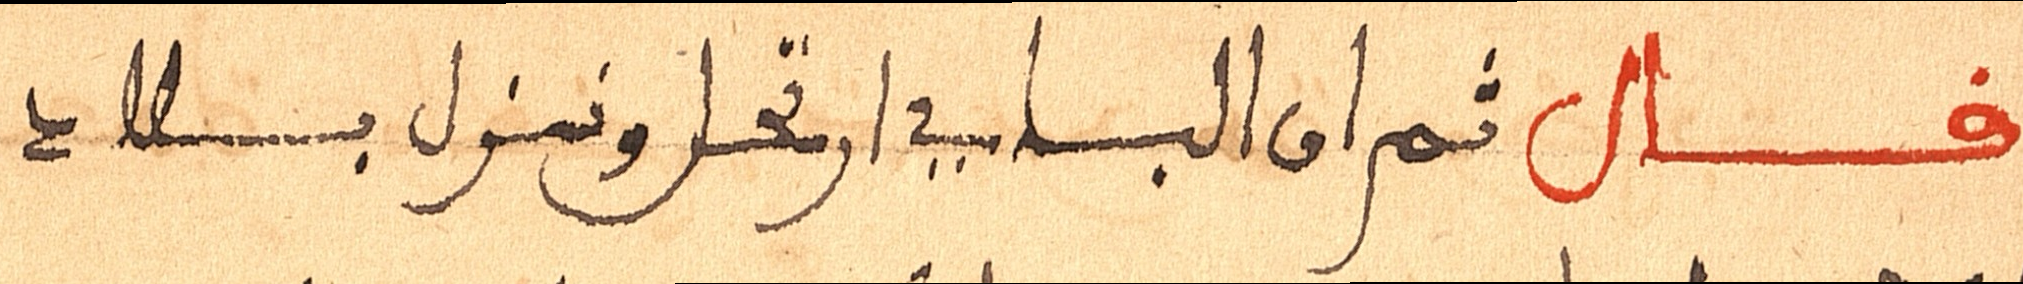قال ثم ان الباي ارتحل وبزل بلاد
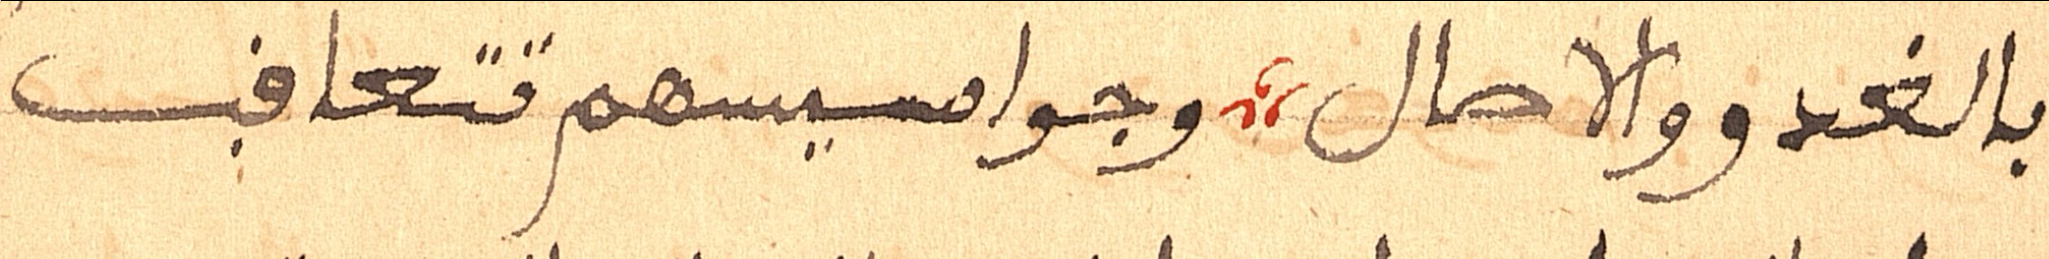بالغدو والاصال وجواسيسهم تتعاقب
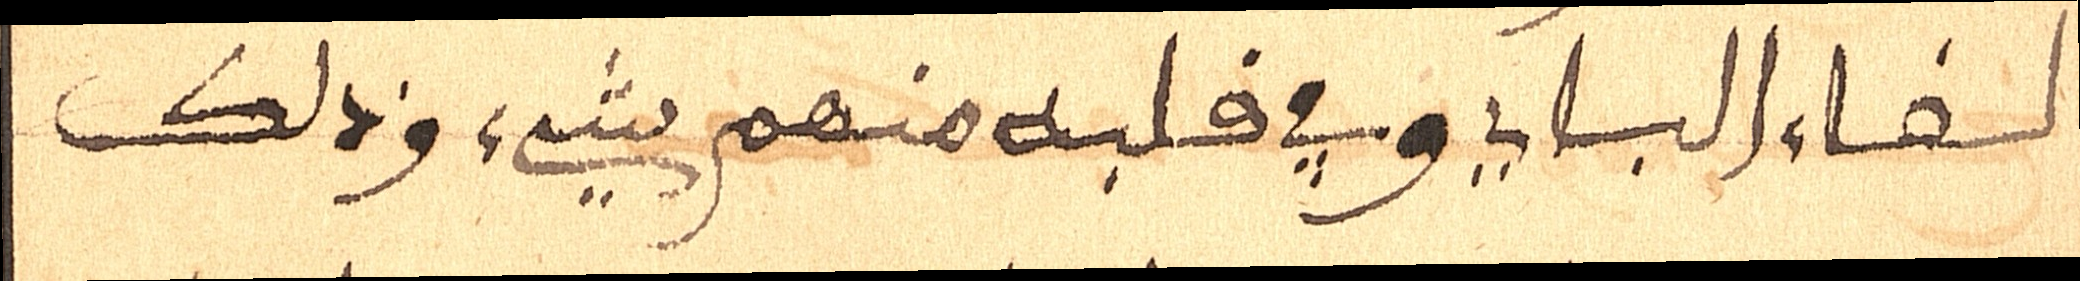لقاء الباي وفي قلبه منهم شيء ذلك
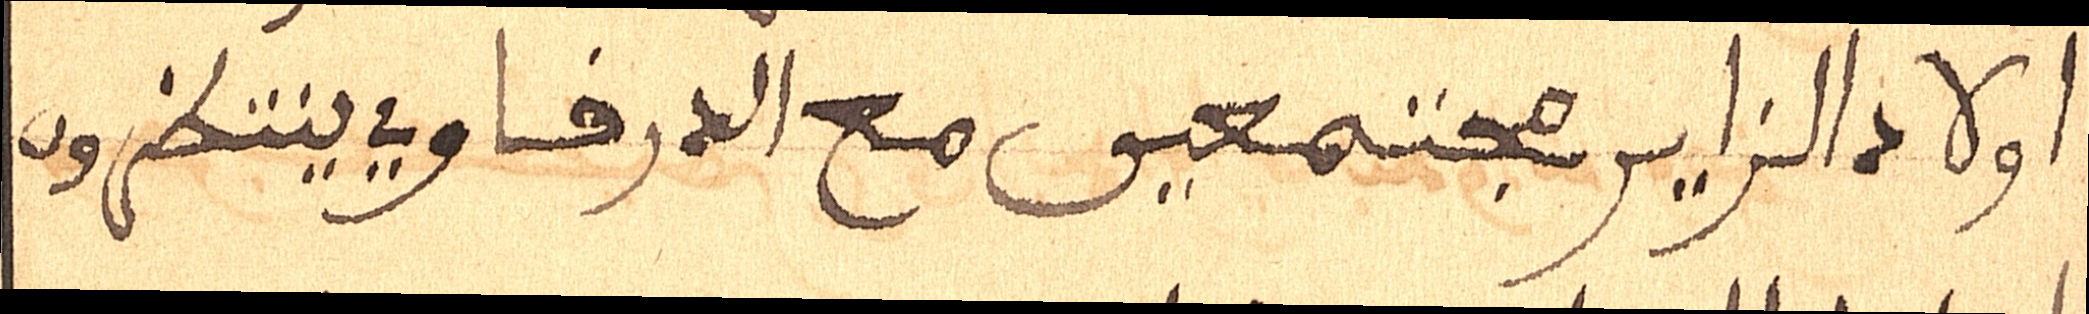اولاد الزاير مجتمعين مع الدرقاوي ينتظرون
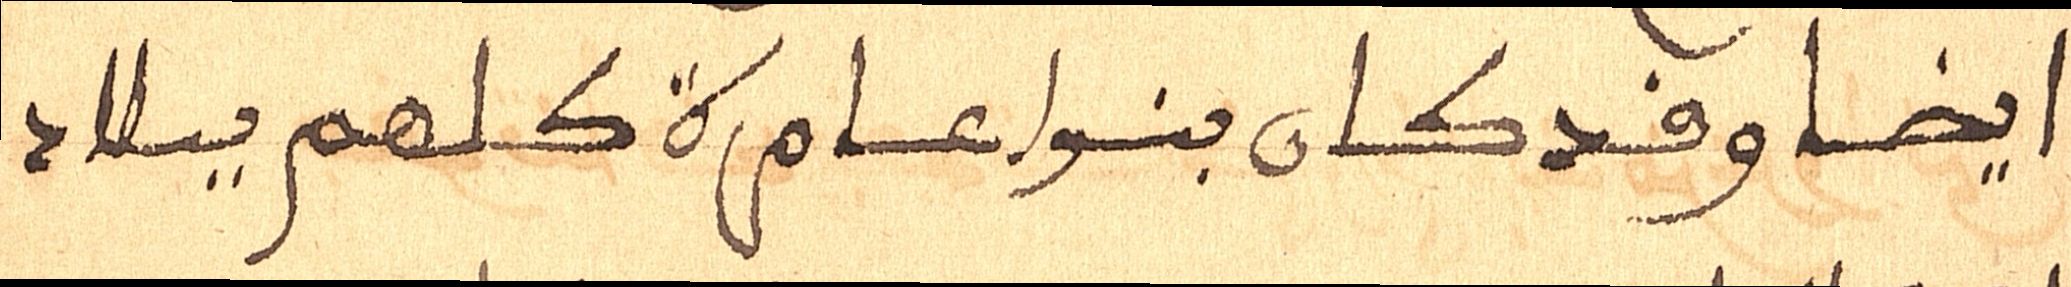ايضا وقد كان بنوا عامرة كلهم ببلاد
